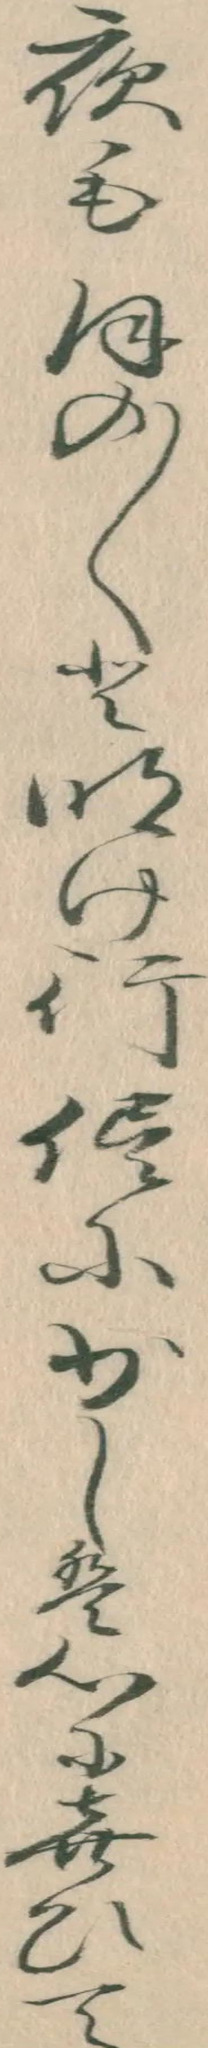夜もほの〳〵と明け行侭に少しは心に喜ひて
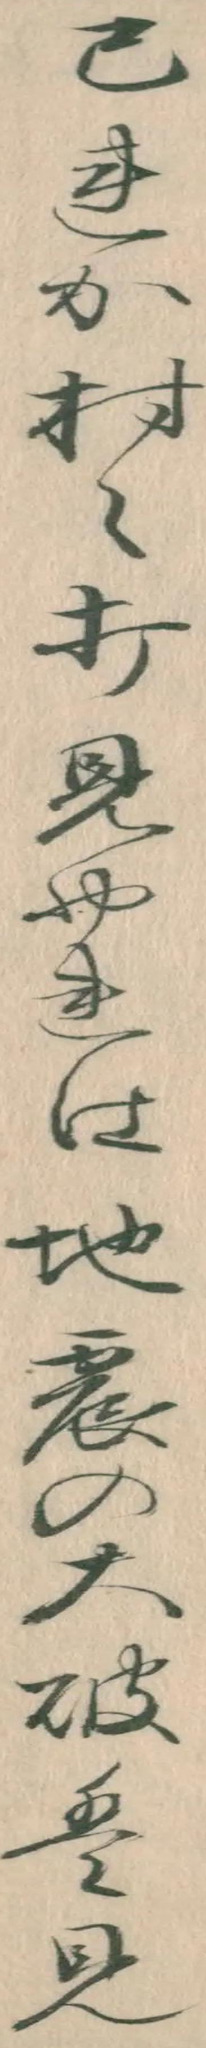己れか村〻打見やれは地震の大破は見
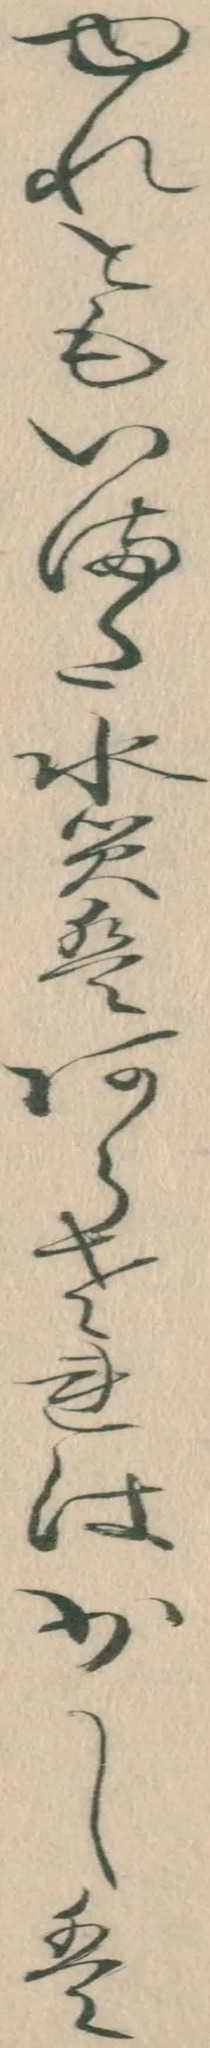ゆれともいまた水災はあらされは少しは
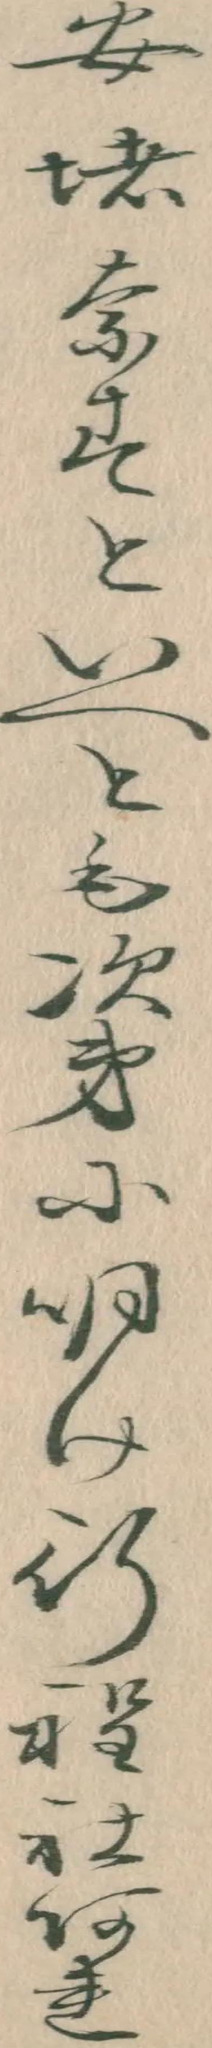安堵なすといへとも次第に明け行程社何れ
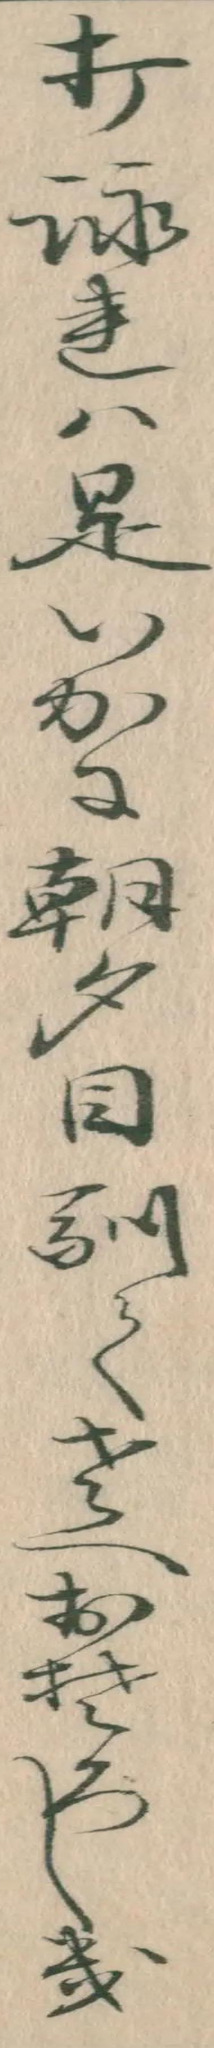打詠れは是いかに朝夕目馴てさへおそろしき
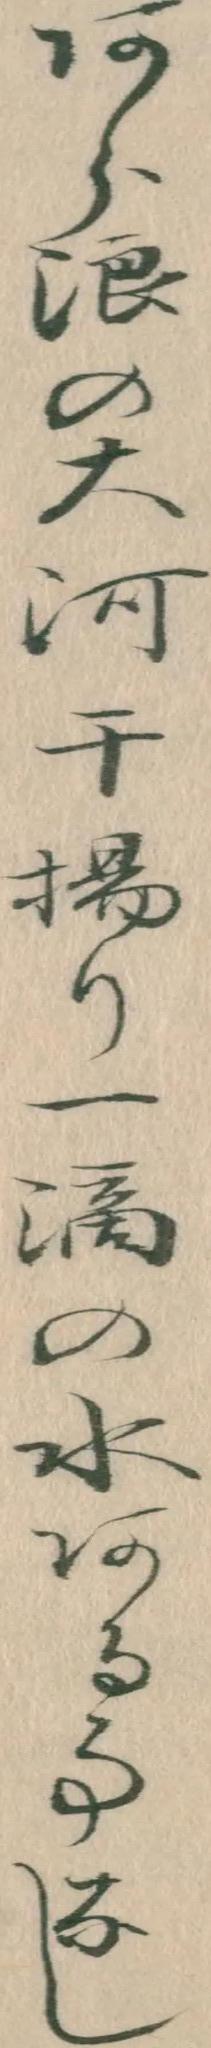あら浪の大河干揚り一滴の水ある事なし
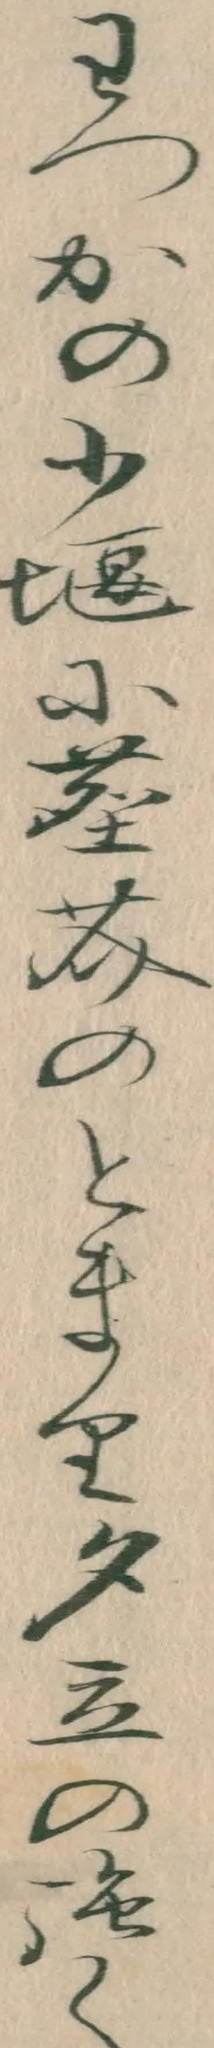わつかの少堰に塵芥のとまり夕立の強く
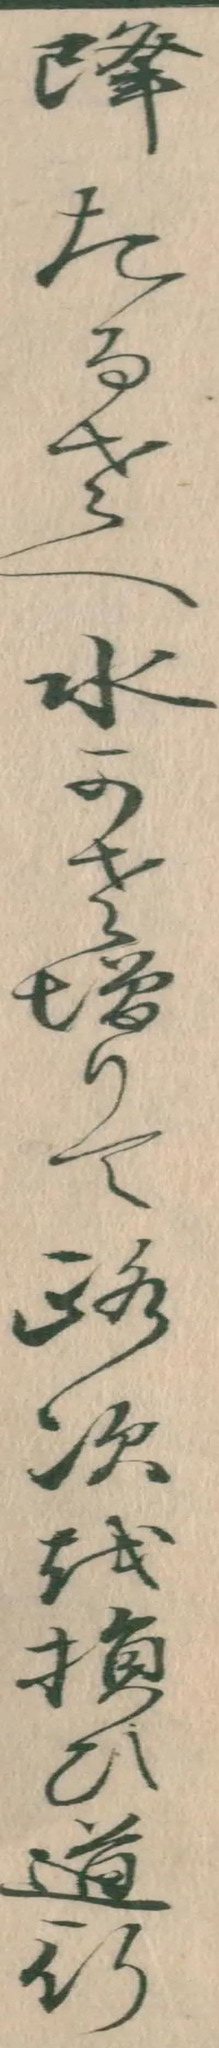降たるさへ水かさ増りて路次を損ひ道行
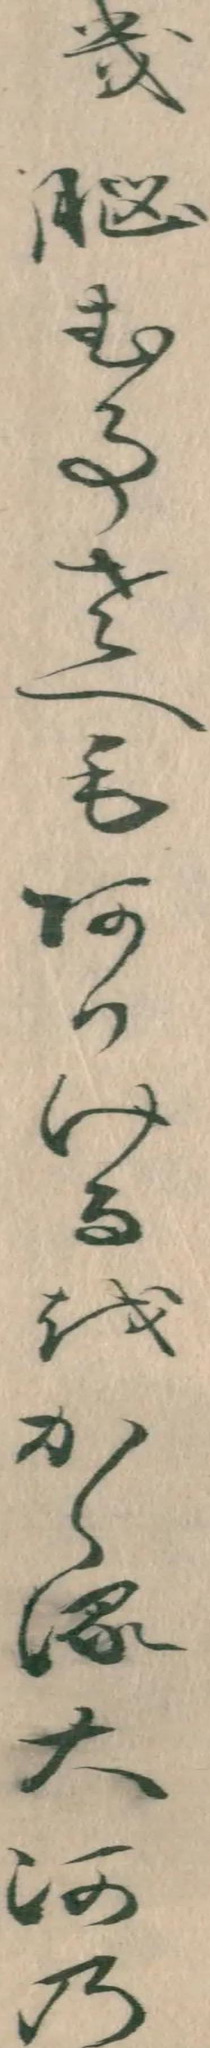き脳む事さへもありけるをかゝる大河の
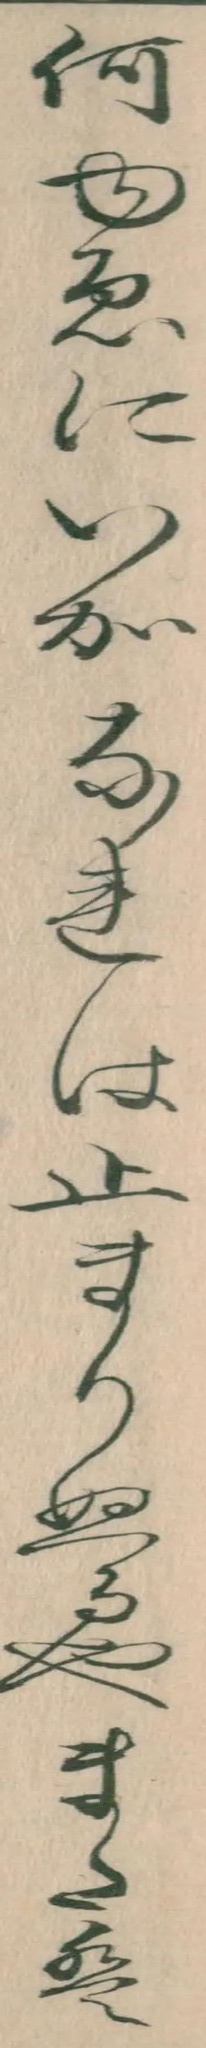何ゆゑにいかなれは止まりぬるやまたは
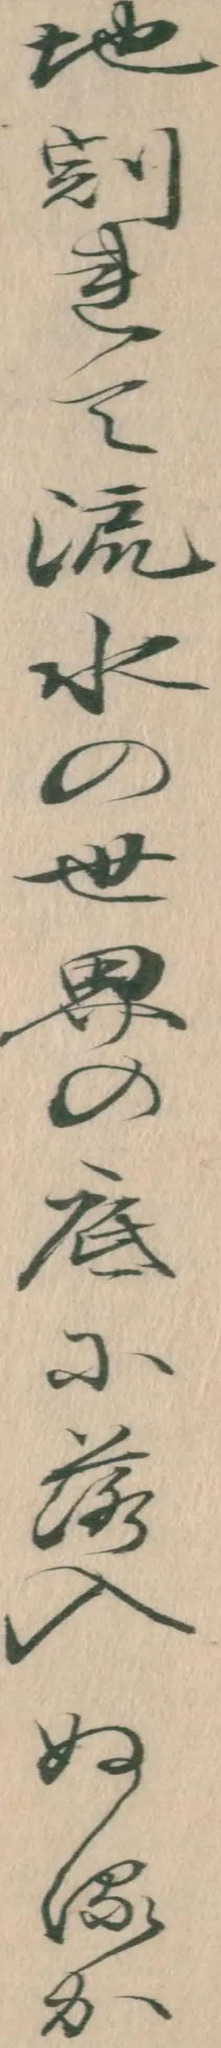地割れて流水の世界の底に落入ぬるか
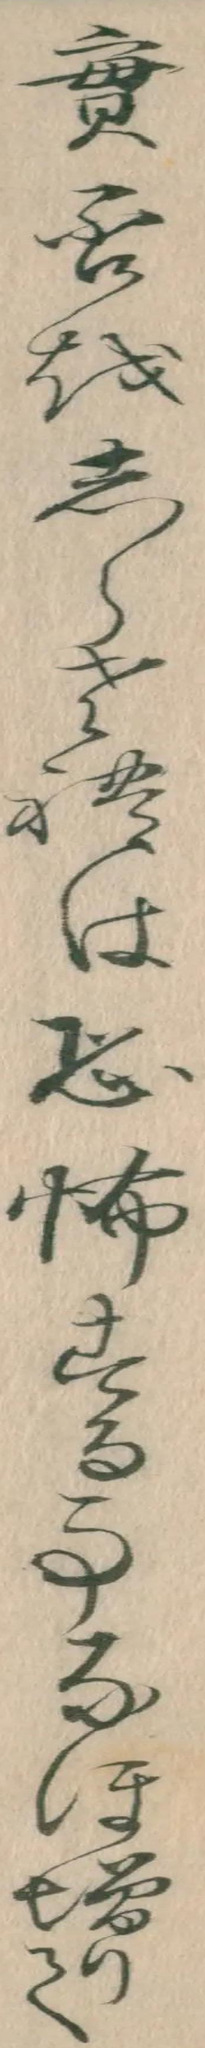実否をしらされは恐怖する事なほ増りて
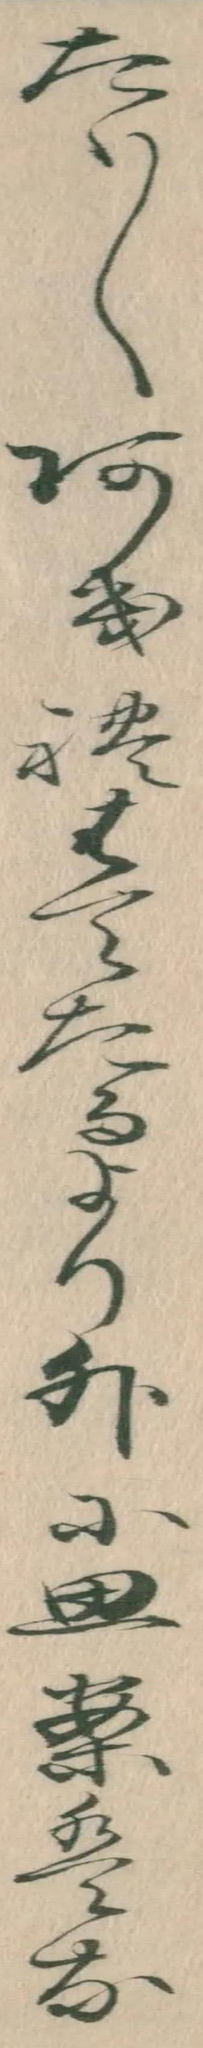たゝ〳〵あきれはてたるより外に思案はな
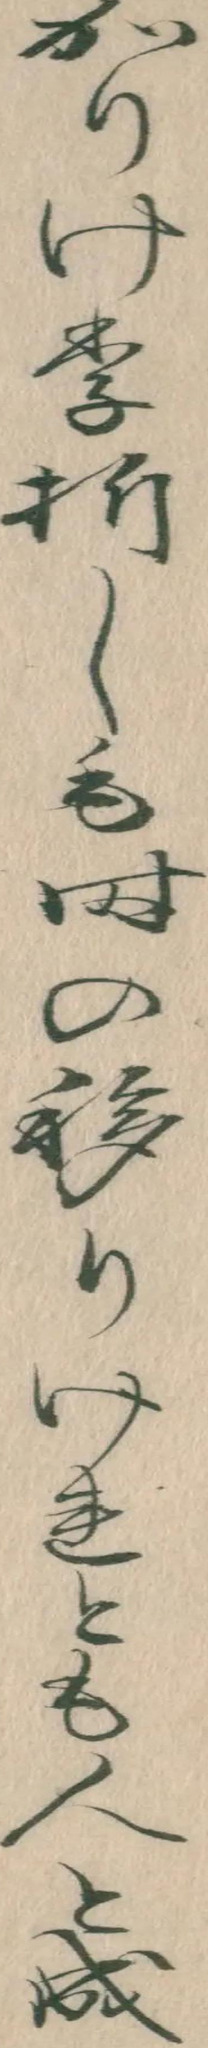かりけり折しも時の移りけれとも人と成
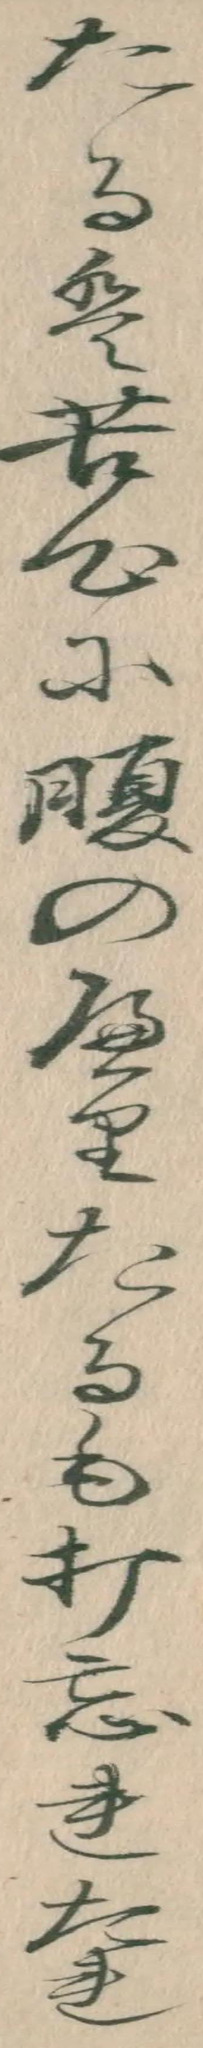たるは苦心に腹のへりたるも打忘れたれ
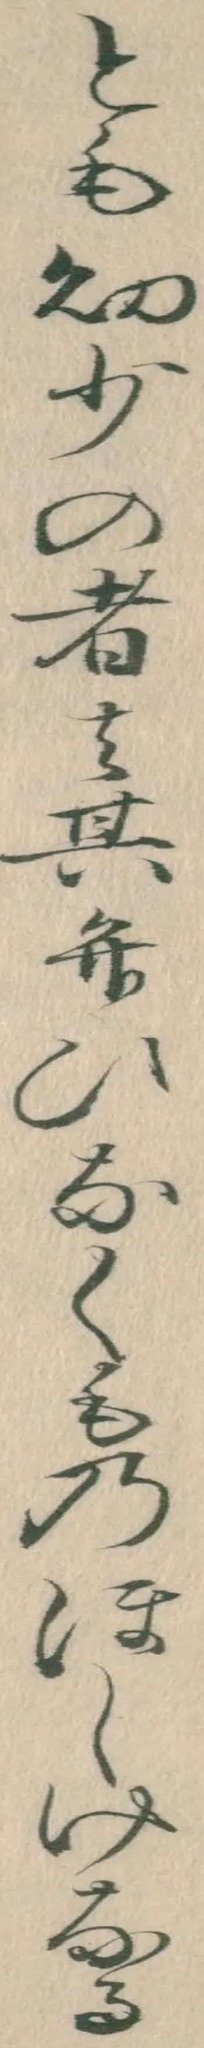とも幼少の者は其弁ひなくものほしけなる
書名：俗語之種. [6]
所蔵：国立国会図書館 National Diet Library, JAPAN
